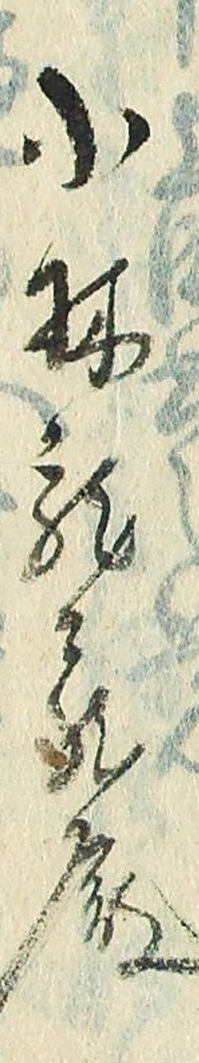小林龍蔵殿

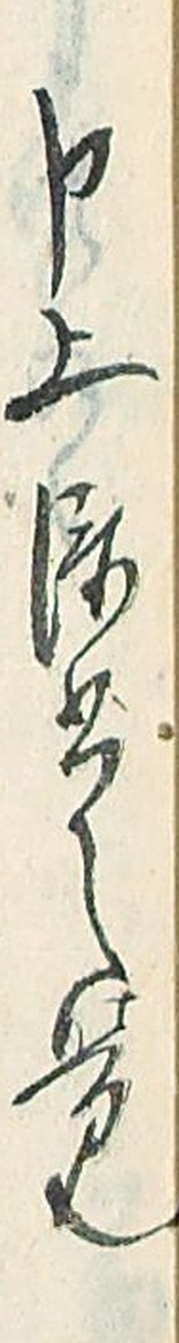申上添書之覚
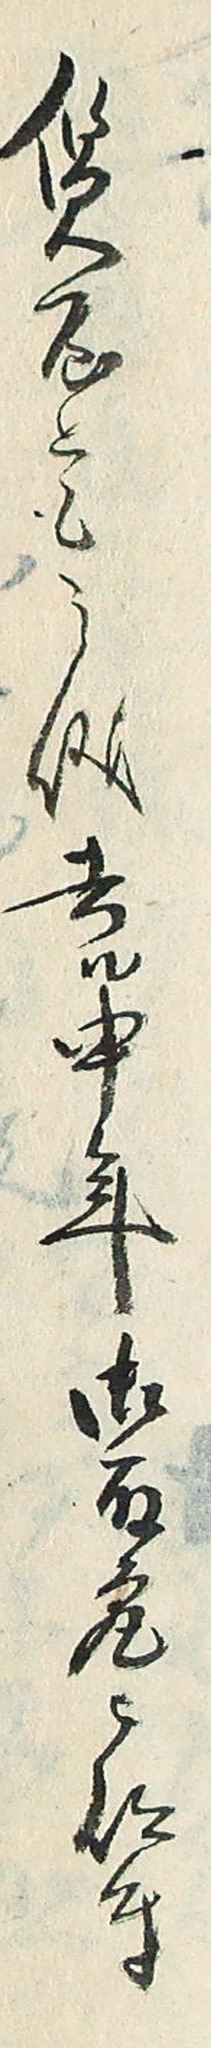賃屋とも之儀去る申年御取究被仰付
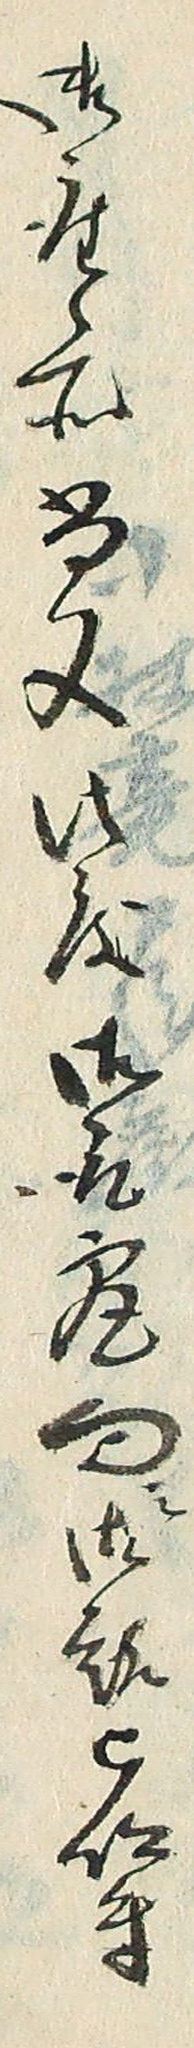御座候所尚又此度御取究向之御趣被仰付
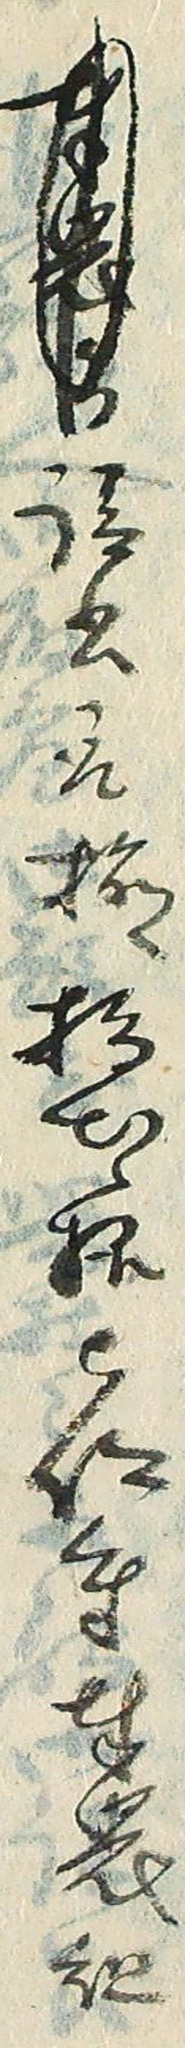請書取揃へ指出候様被仰付奉畏組
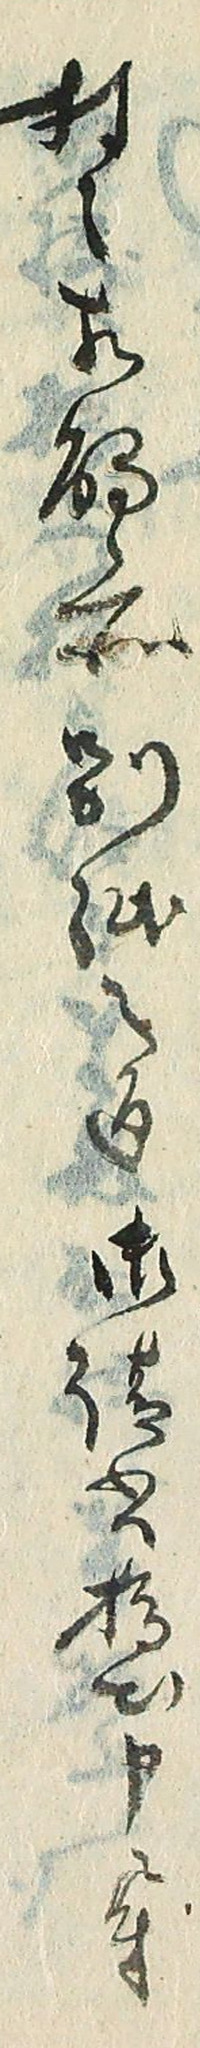村々相触候所別紙之通御請書指出申に付
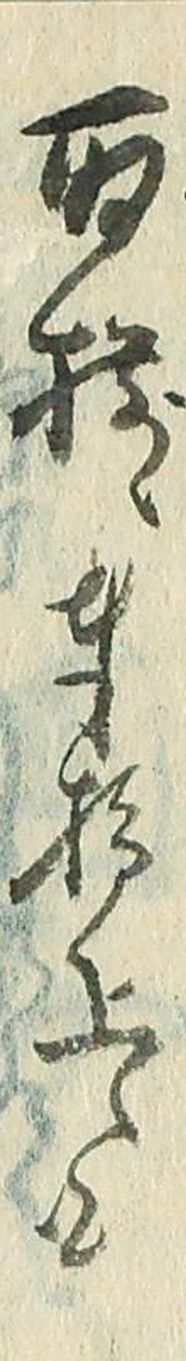取揃へ奉指上候以上
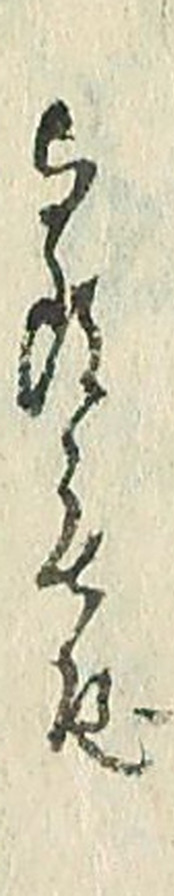与頭庄屋
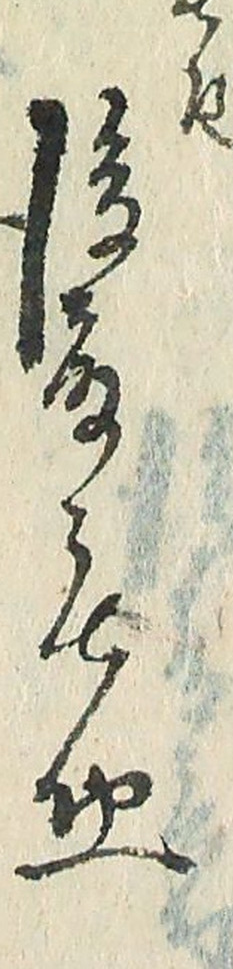後藤庄助
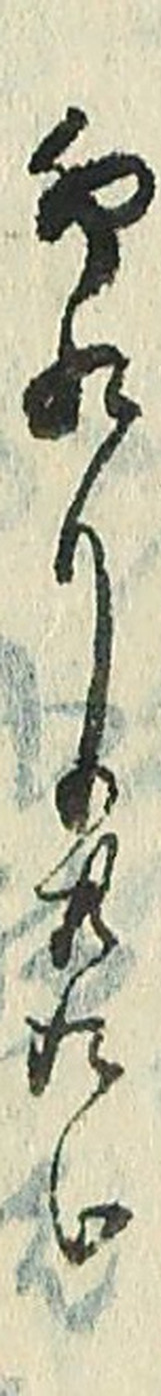卯九月廿九日
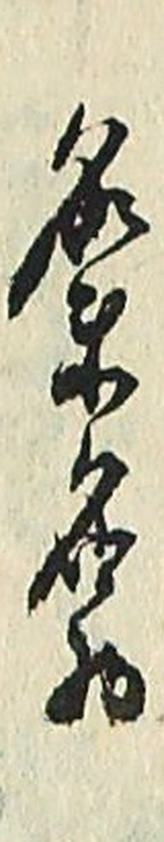名東名西
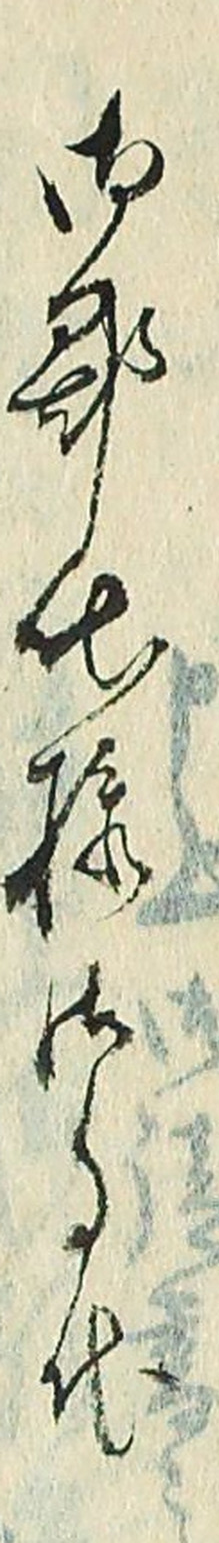御郡代様御手代
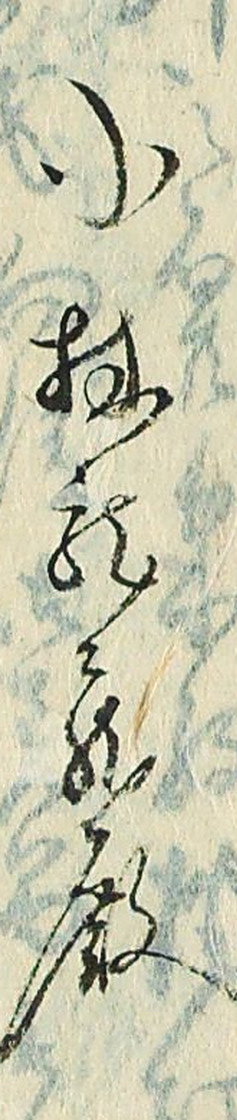小林龍蔵殿
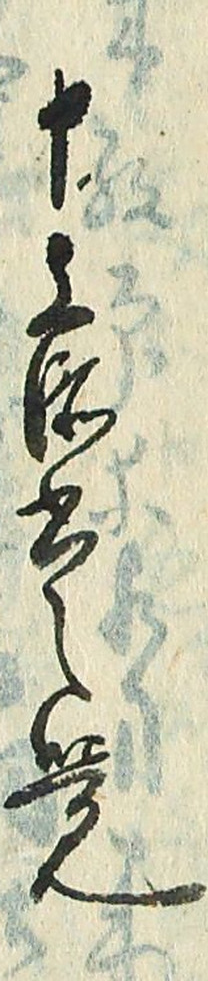申上添書之覚
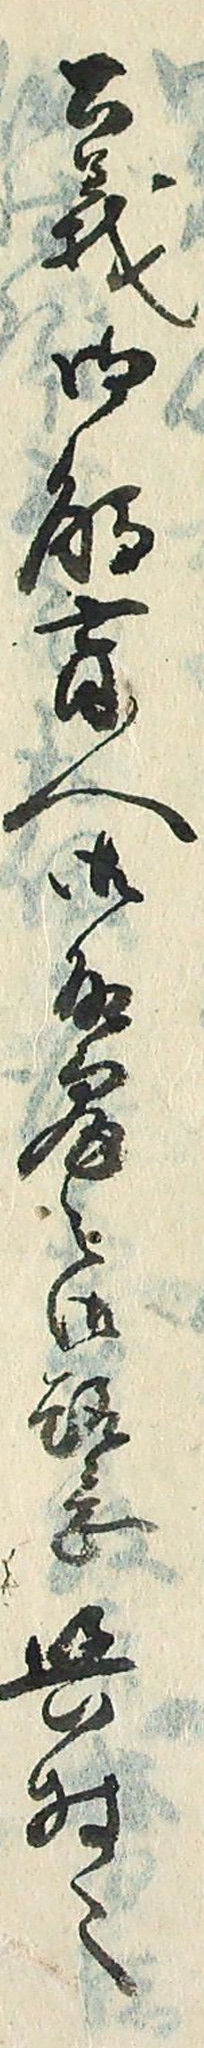公儀御触盲人御取究之御趣意与村々
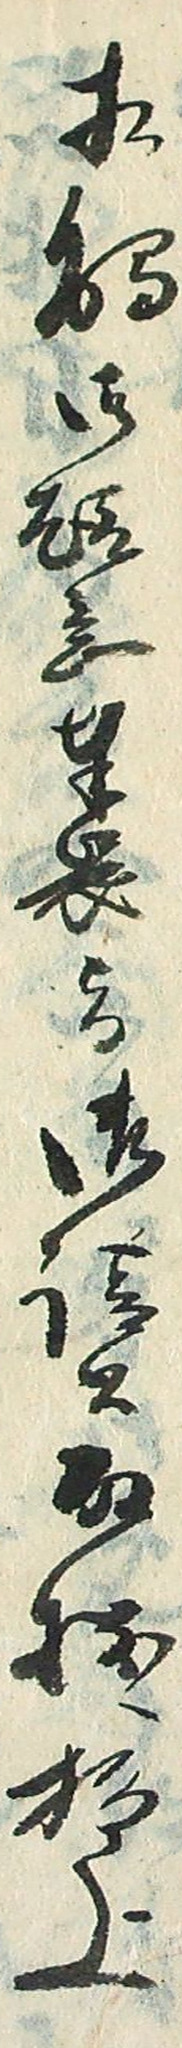相触御趣意奉畏旨御請書取揃へ指上
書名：諸御用御□受書控
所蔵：鳴門教育大学 Naruto University of Education
